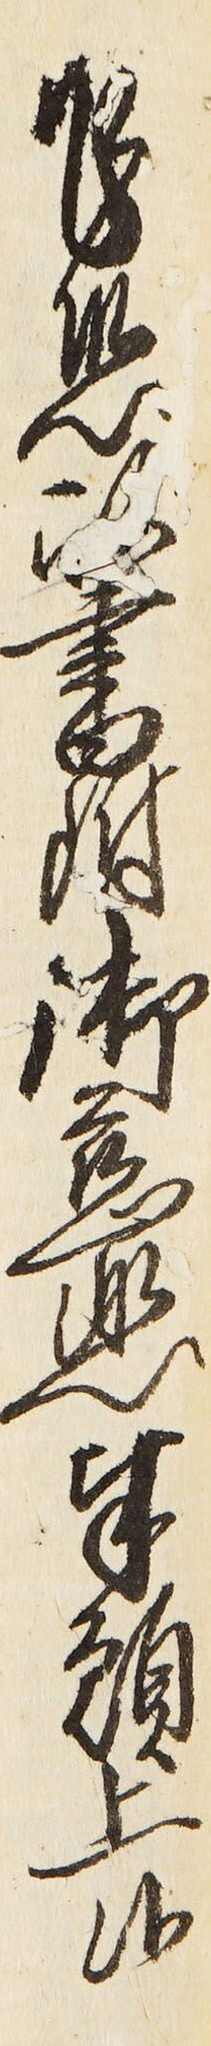乍恐以書付御慈悲奉願上候
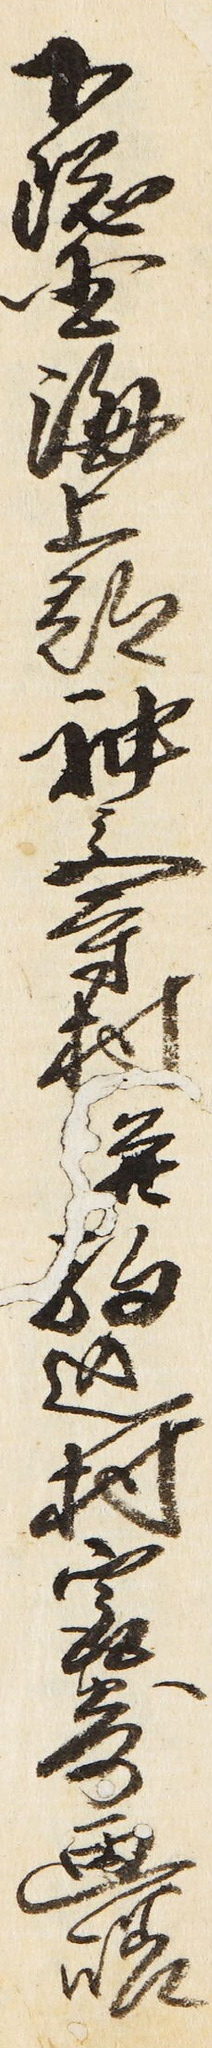一下総国海上郡神宮寺村并駒込村最寄匝瑳
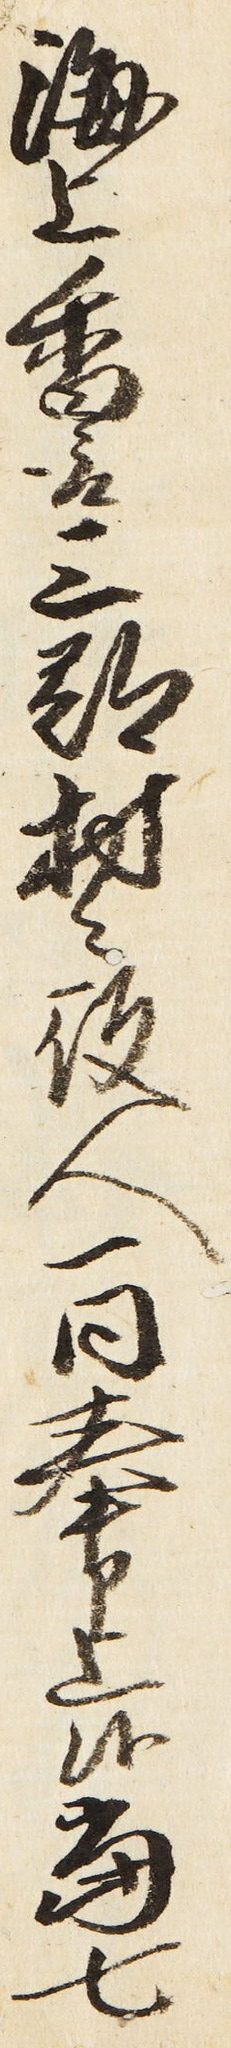海上香取三郡村々役人一同奉申上候当七
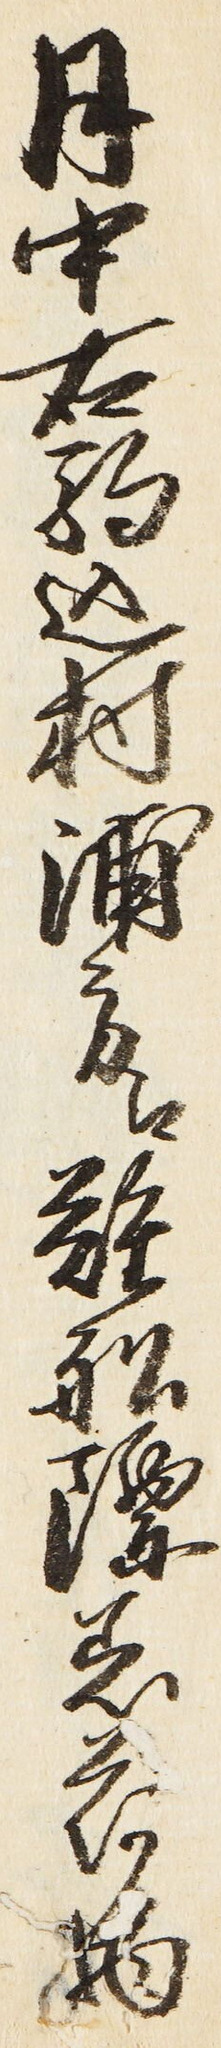月中右駒込村浦方江難船漂着荷物
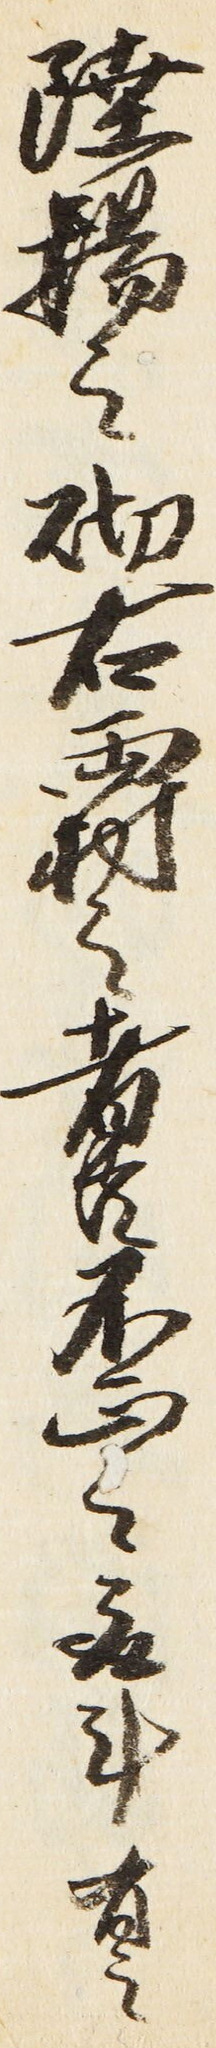陸揚之砌右両村之者共不正之取計有之
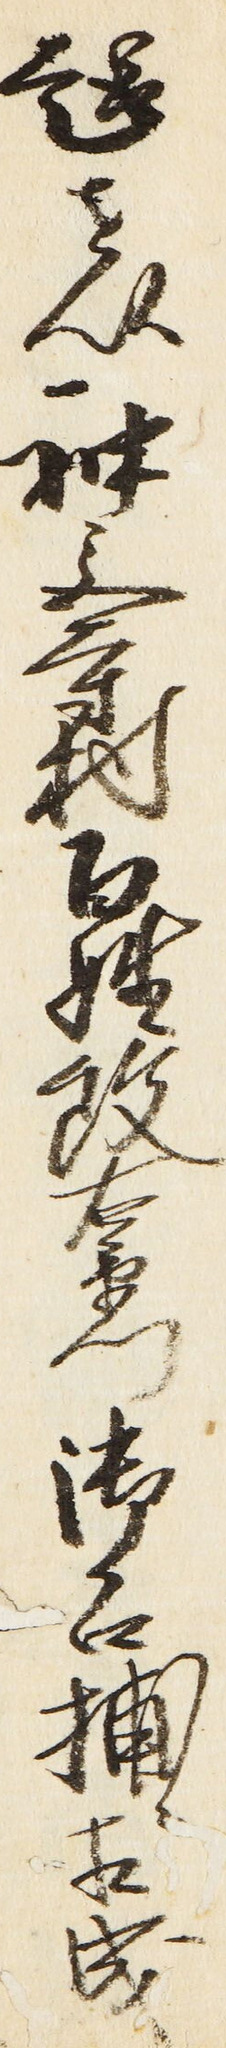趣を以神宮寺村百姓政右衛門御召捕ニ相成
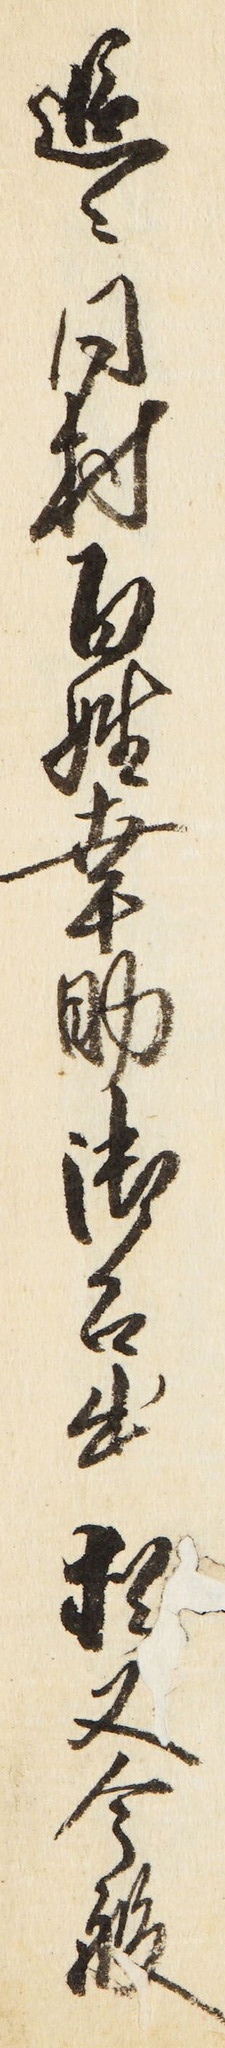追々同村百姓幸助御召出猶又今般

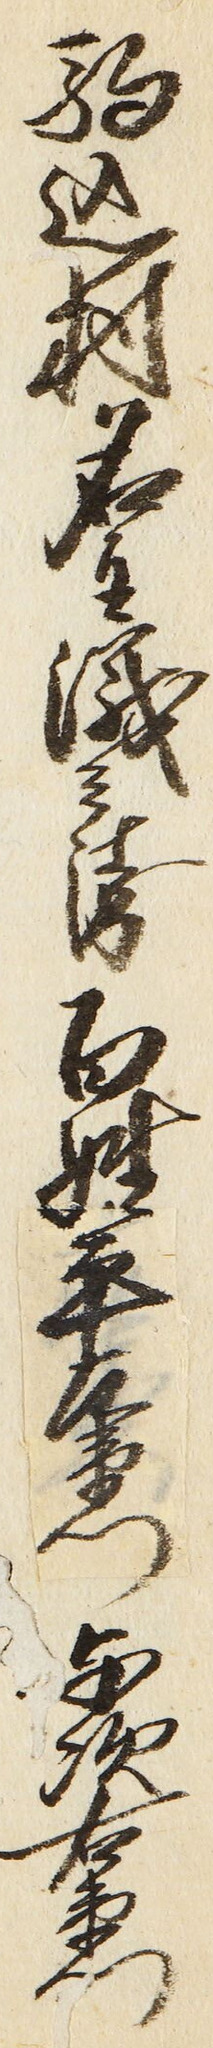駒込村名主儀兵衛百姓平左衛門与次右衛門
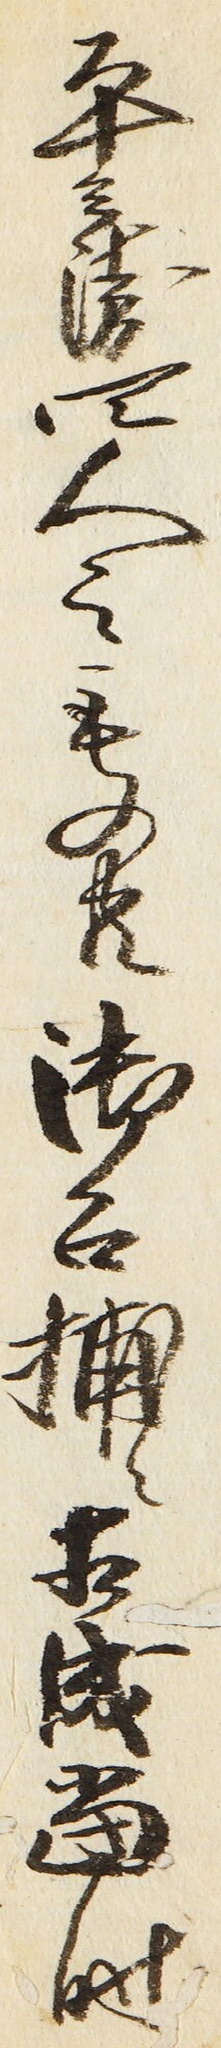平兵衛四人之もの共御召捕ニ相成当時
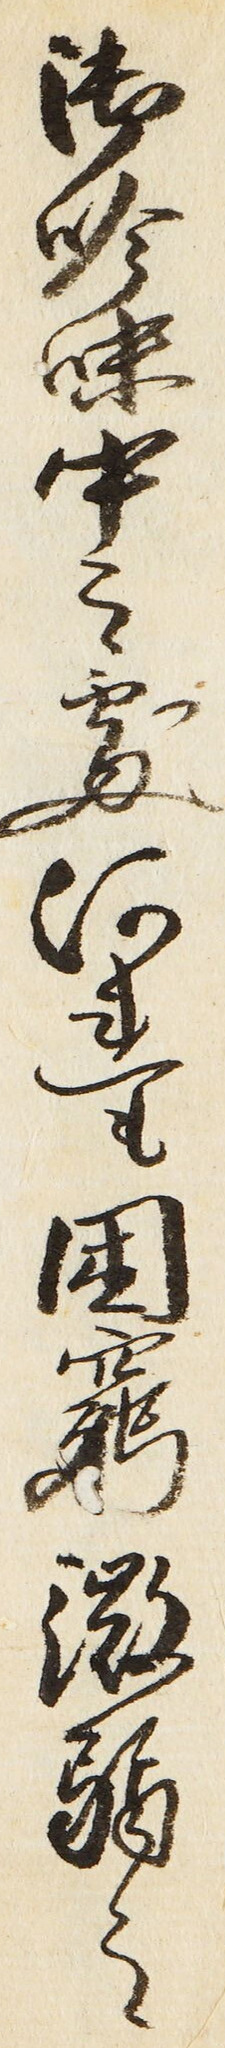御吟味中之処何れも困窮微弱之
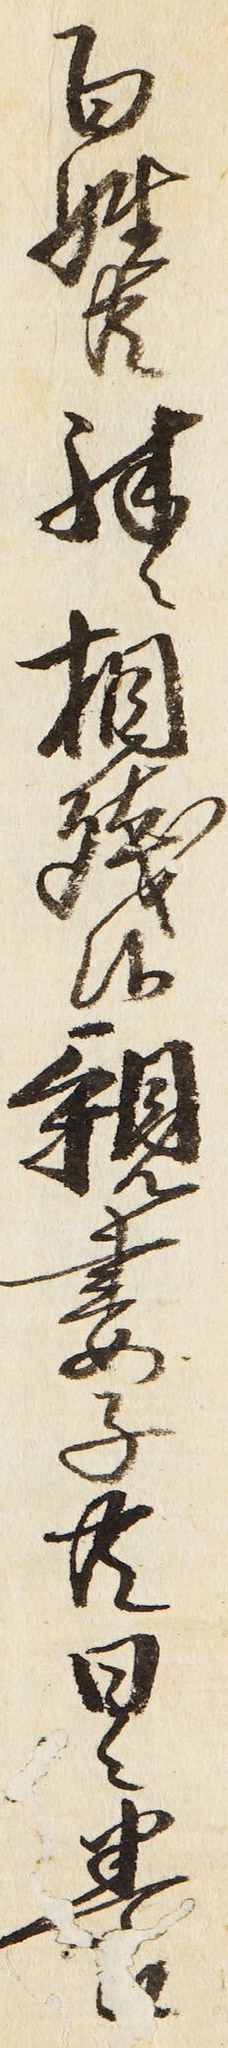百姓共殊ニ相残候親妻子共日々養
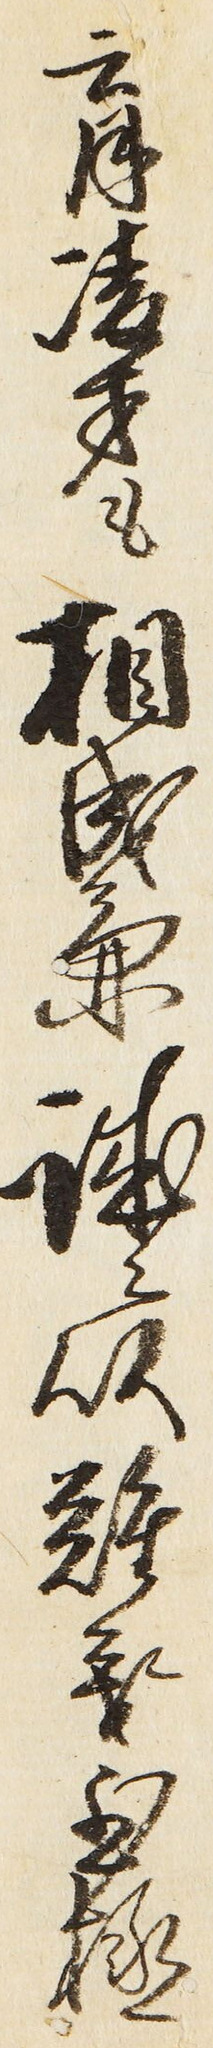育凌才も相成兼誠ニ以難義至極
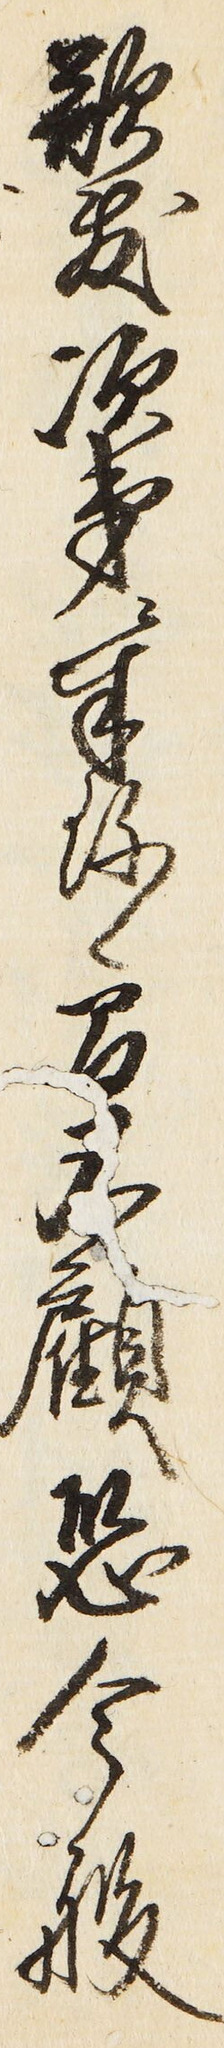歎敷次第ニ奉存候間不顧恐今般
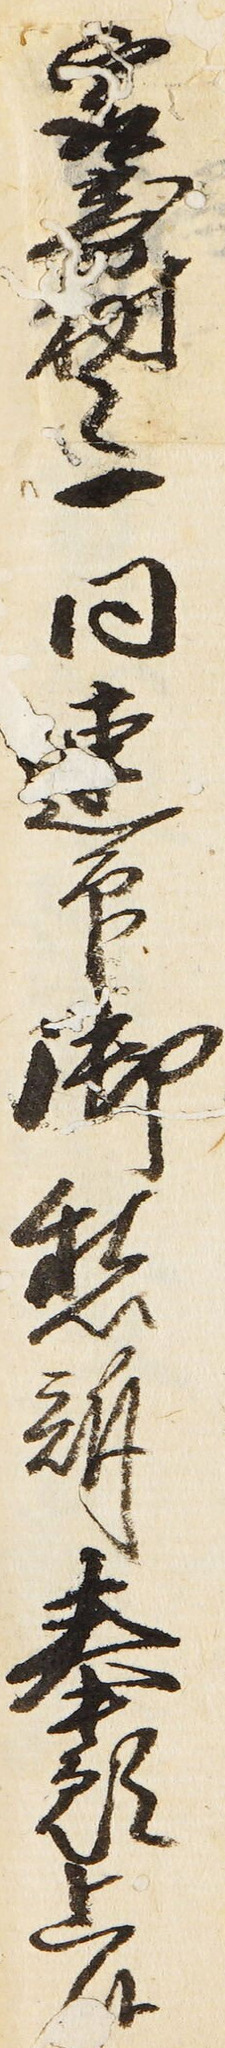最寄村々一同連印御愁訴奉願上候
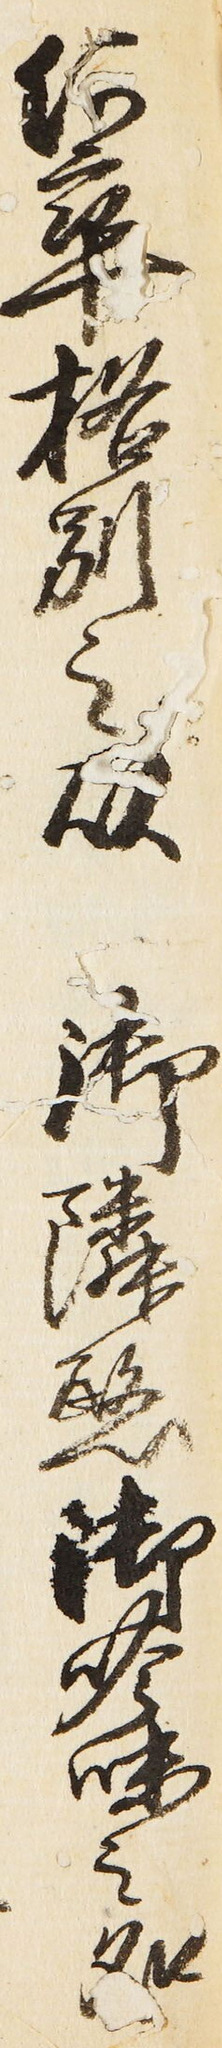何卒格別之以御隣愍御吟味之処
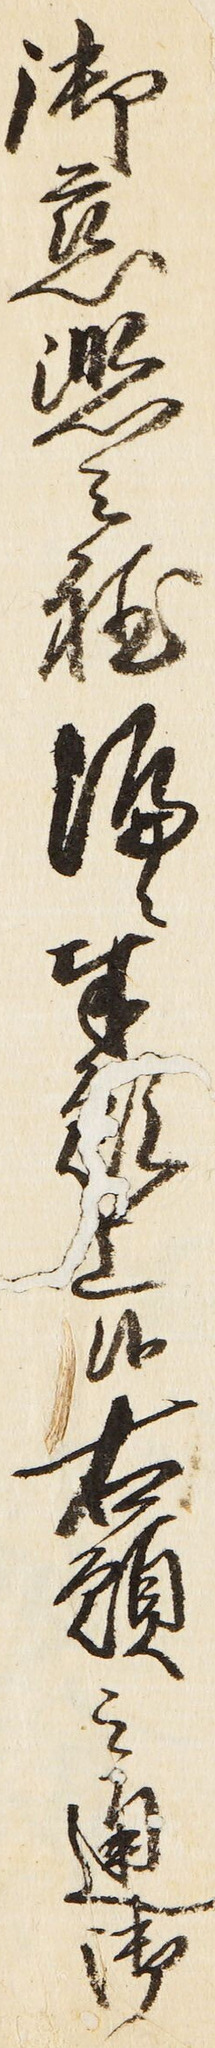御慈悲之程偏ニ奉願上候右願之通御
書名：難船一件記録
